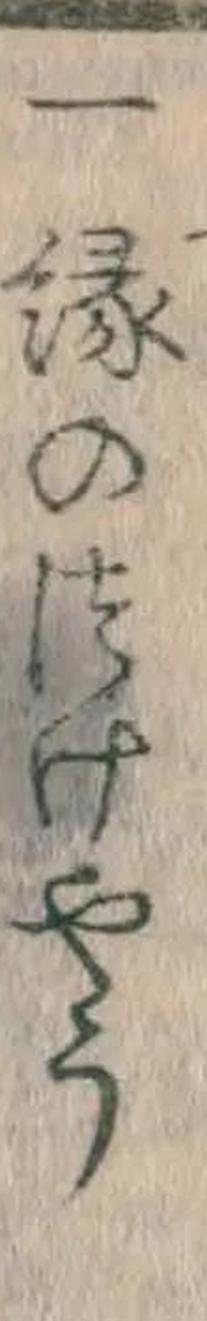一緑のつけやう
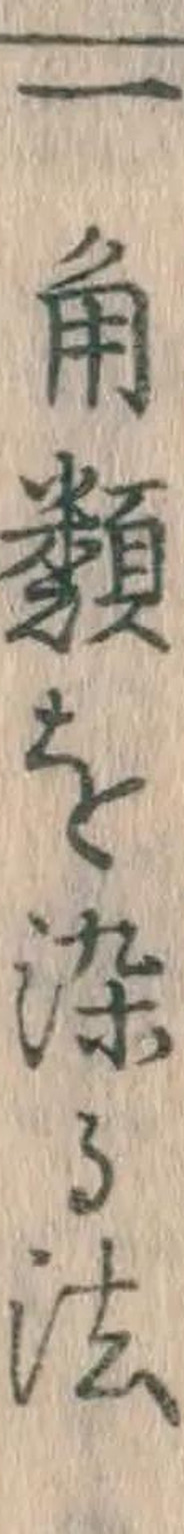一角類を染る法
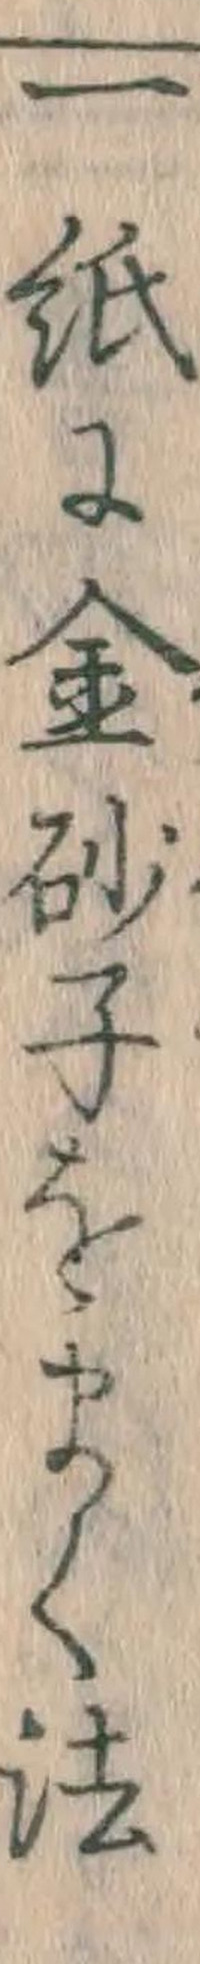一紙に金砂子をまく法
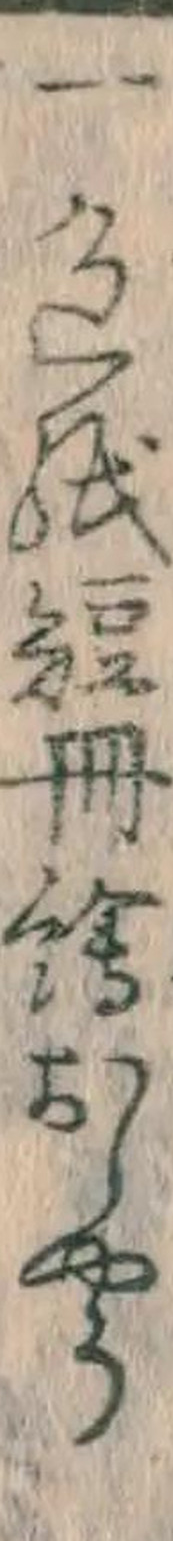一色紙短冊絵おしやう
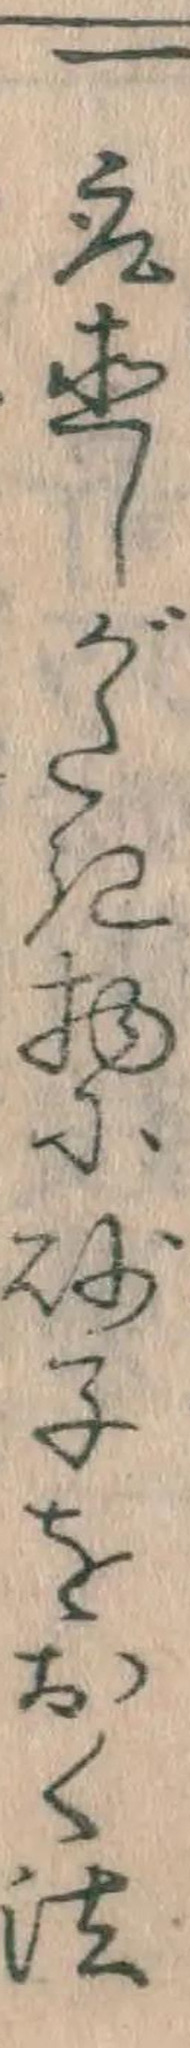一取直しがたき物に砂子をおく法
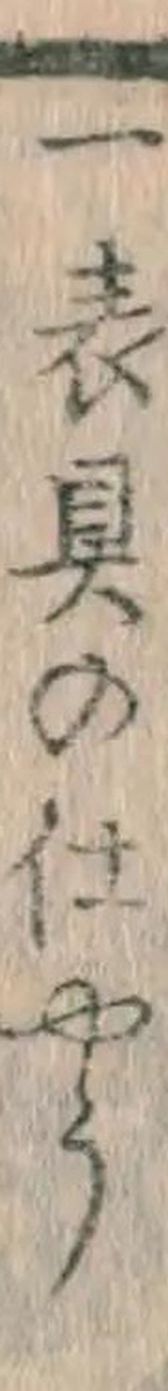一表具の仕やう
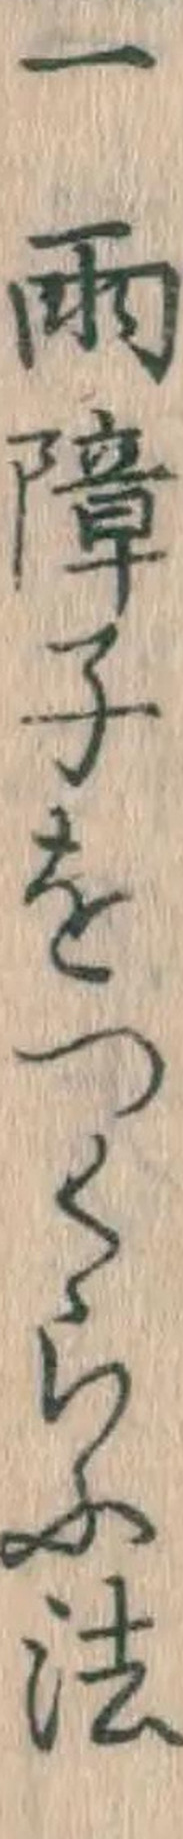一雨障子をつくらふ法
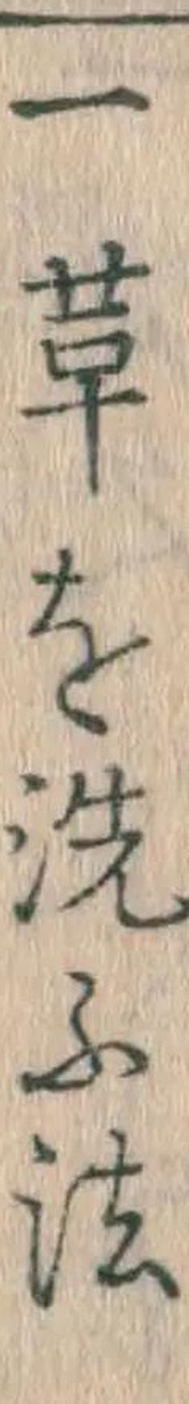一革を洗ふ法
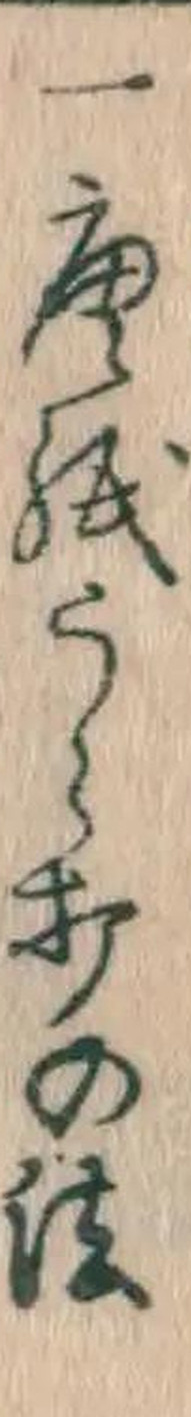一唐紙うら打の法
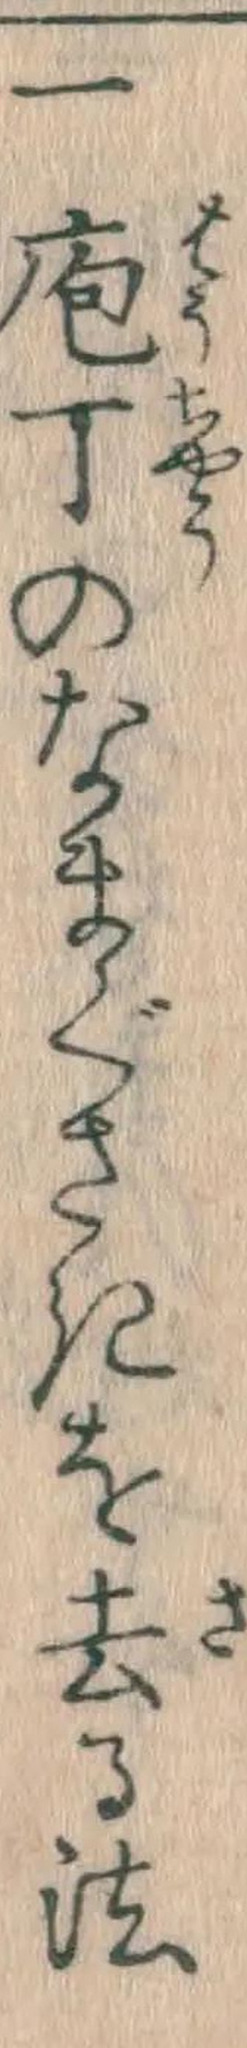一庖丁のなまぐさきを去る法
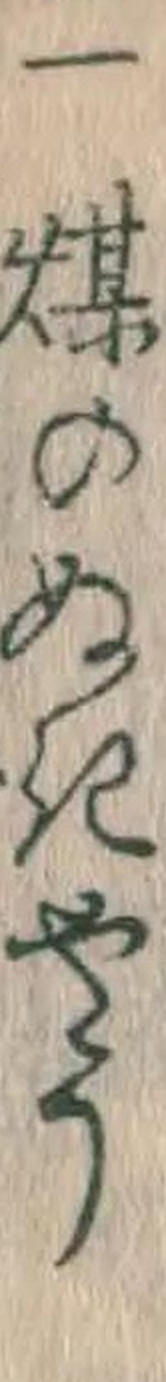一煤のぬきやう
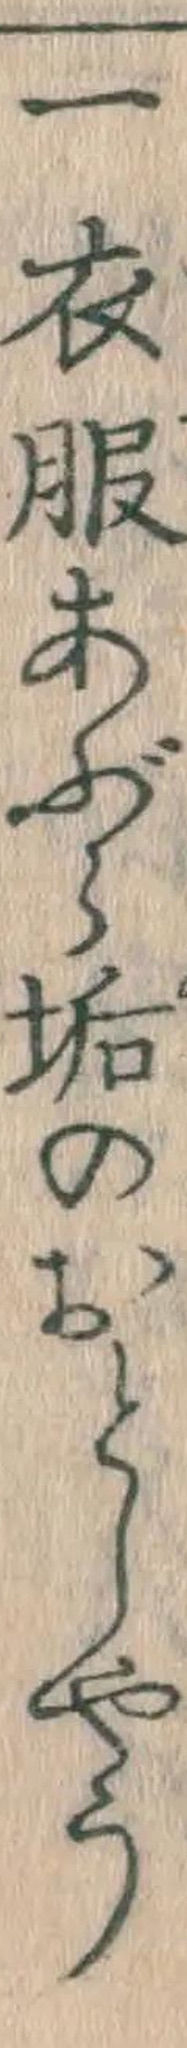一衣服あぶら垢のおとしやう
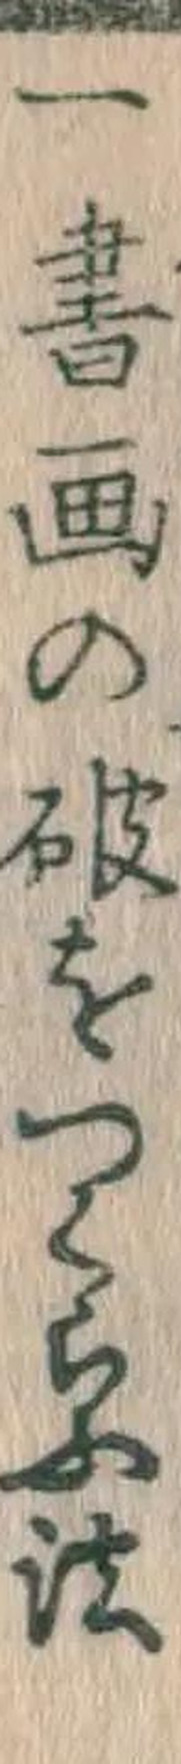一書画の破をつくらふ法
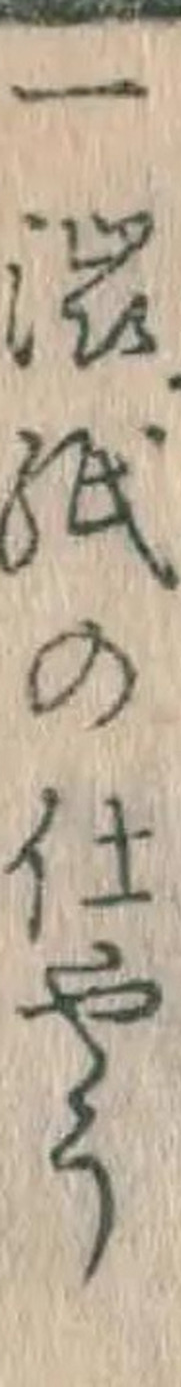一表具の仕やう
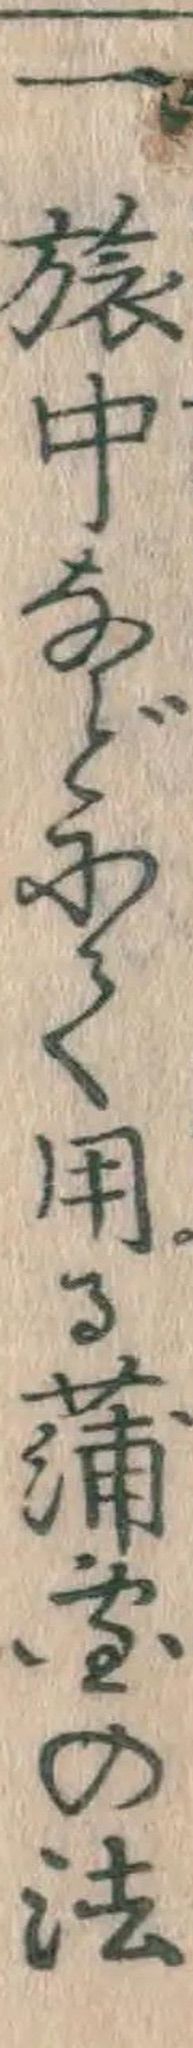一旅中などにて用る蒲団の法
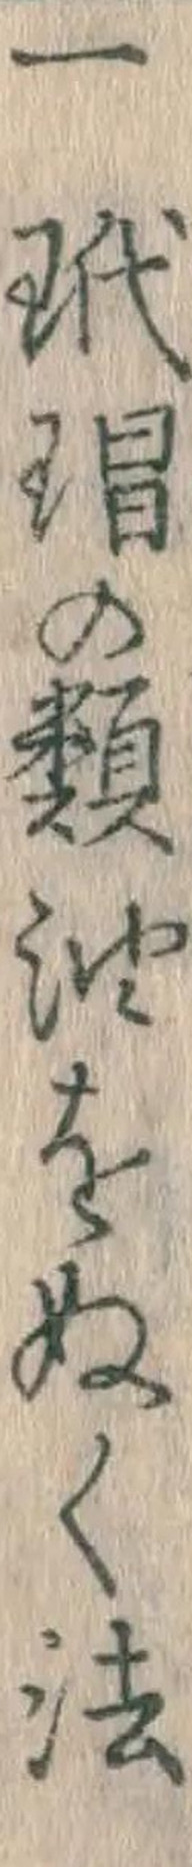一玳瑁の類油をぬく法
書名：広益秘事大全 3巻. [1]
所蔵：国立国会図書館 National Diet Library, JAPAN
